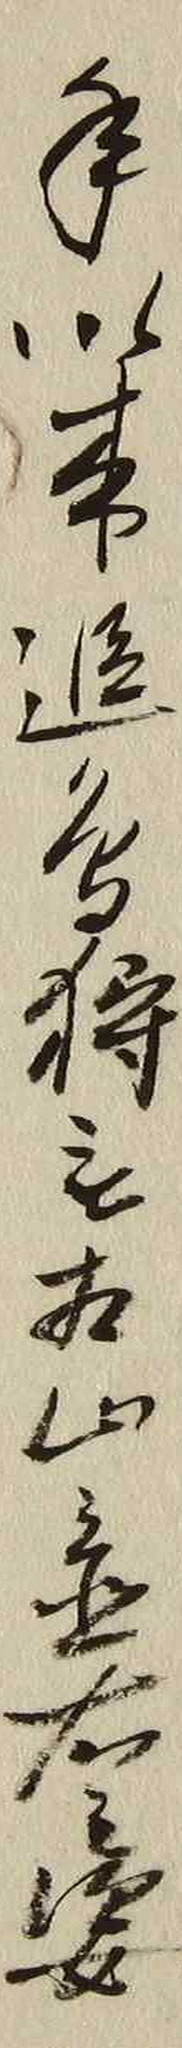年以来追鳥狩被相止置右之姿
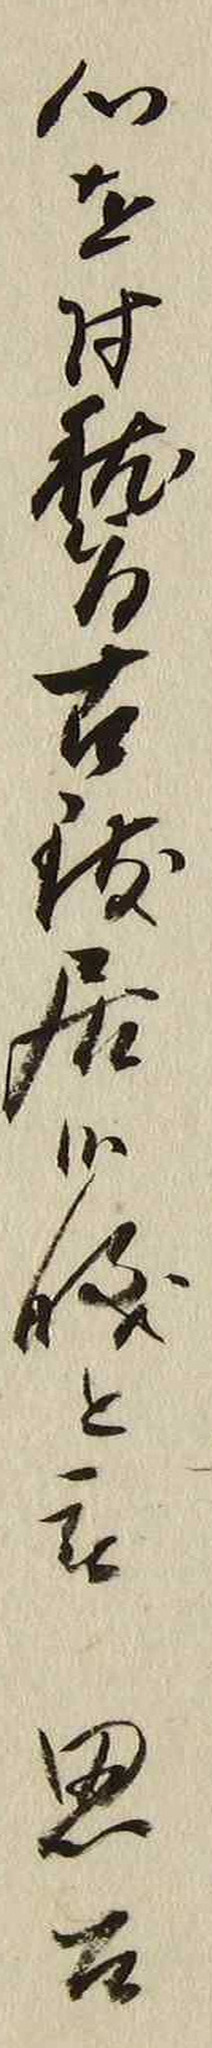心を付稽古致居候儀と被思召
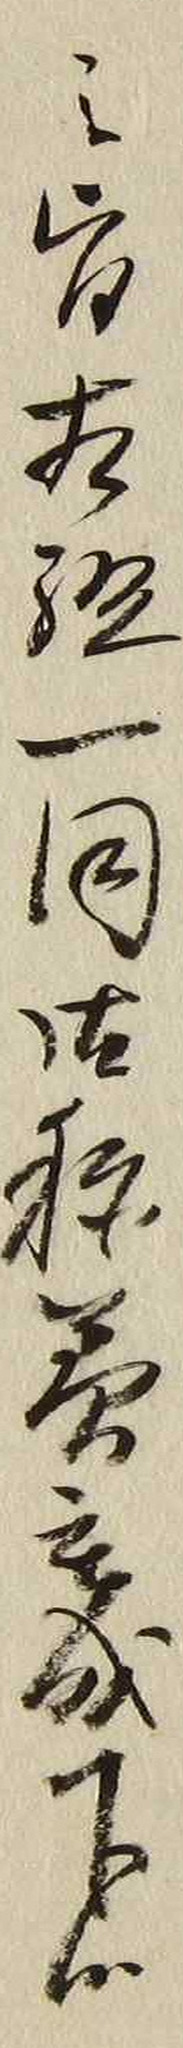之旨相組一同御称美被成下候
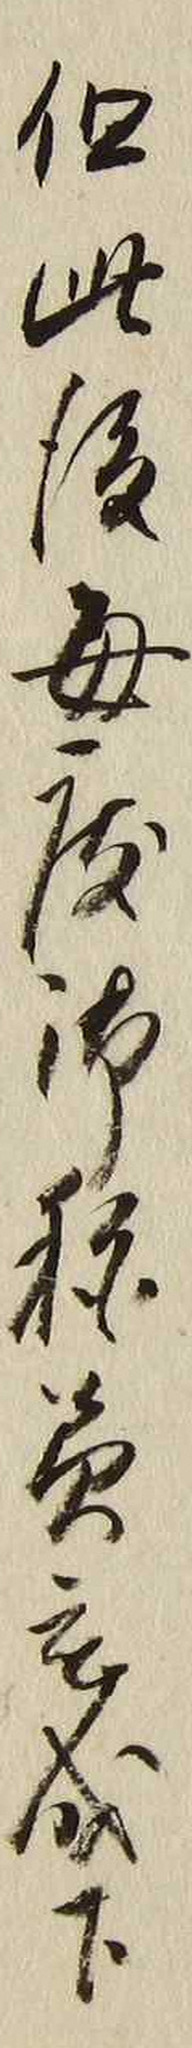但此後毎度御称美被成下

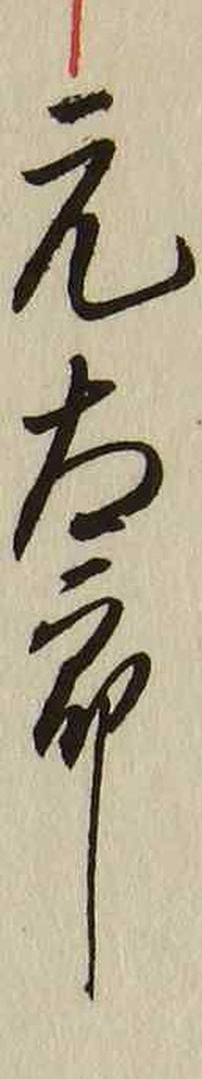元太郎
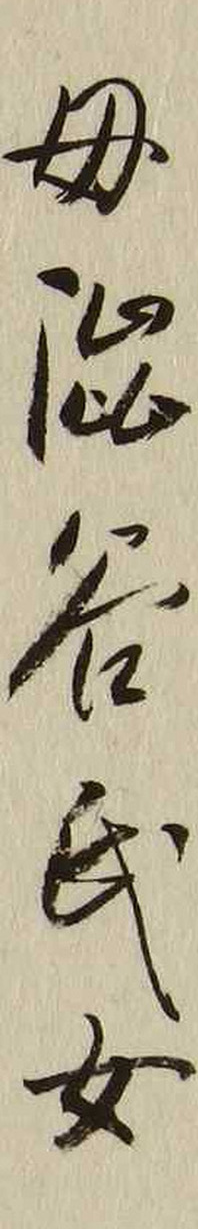母渋谷氏女
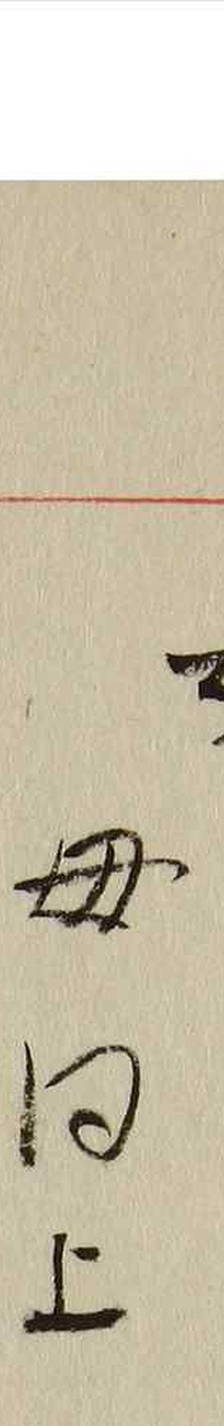母同上
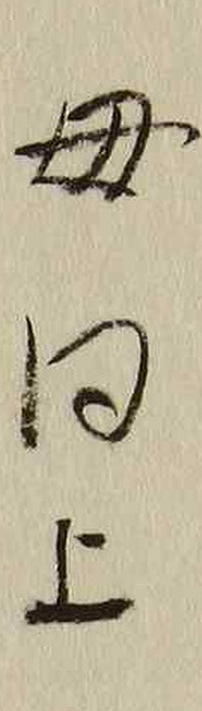母同上
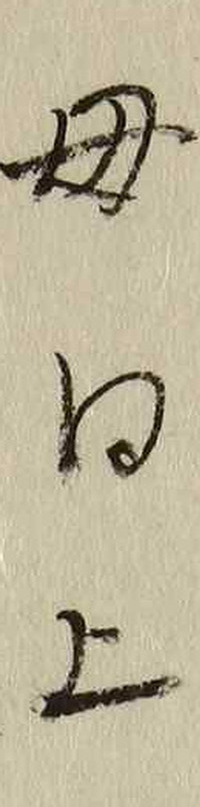母同上
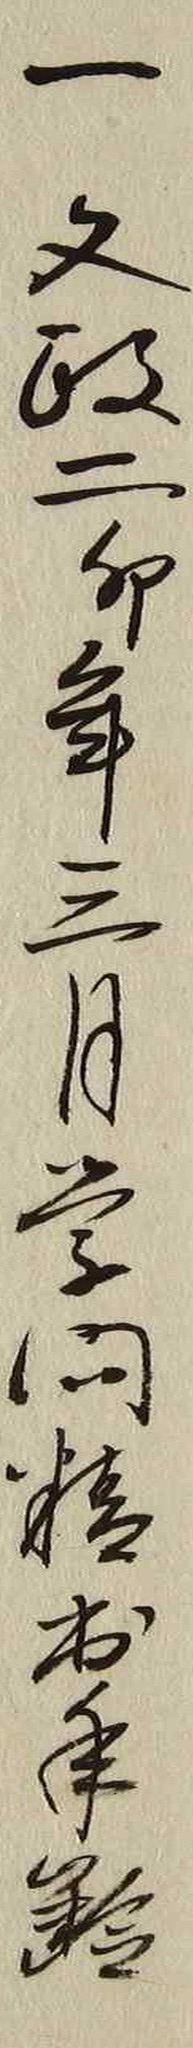一文政二卯年三月学問精出年齢
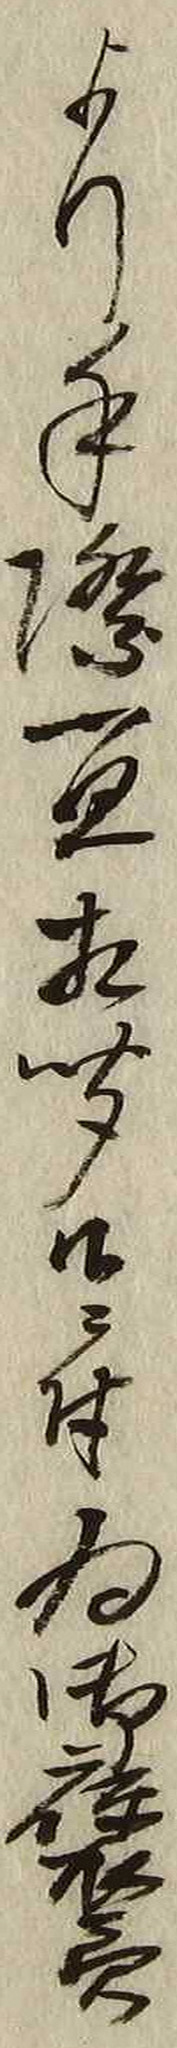より手際宜相聞候付為御褒美
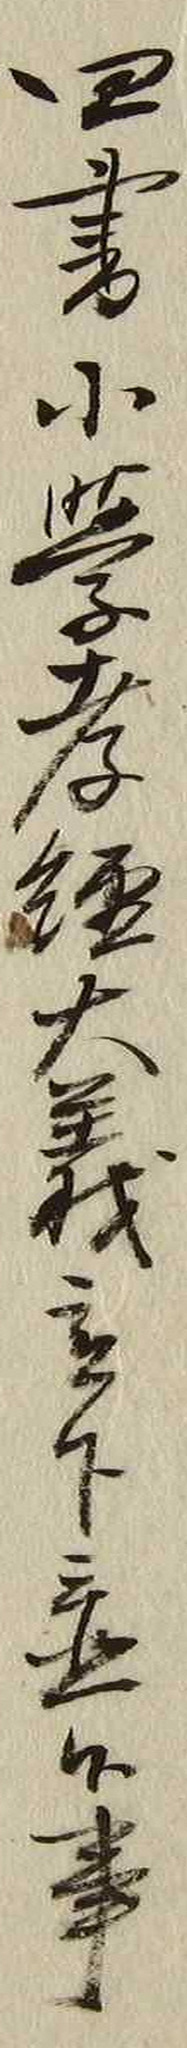四書小学孝経大義被下置候事
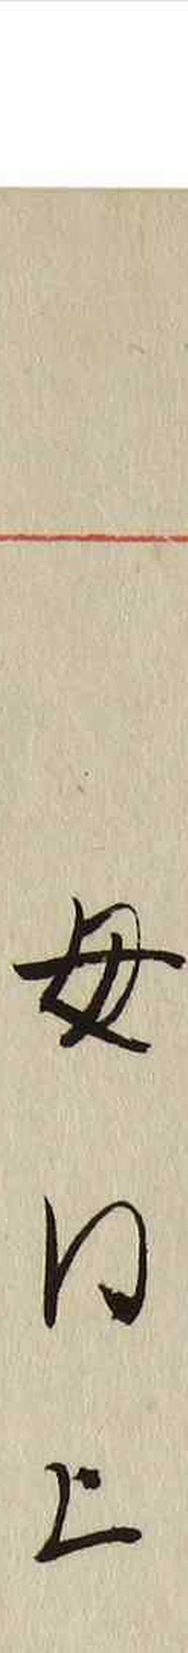母同上
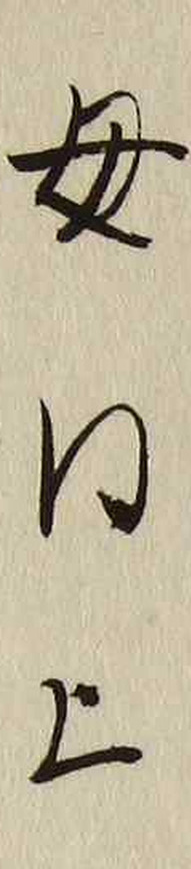母同上
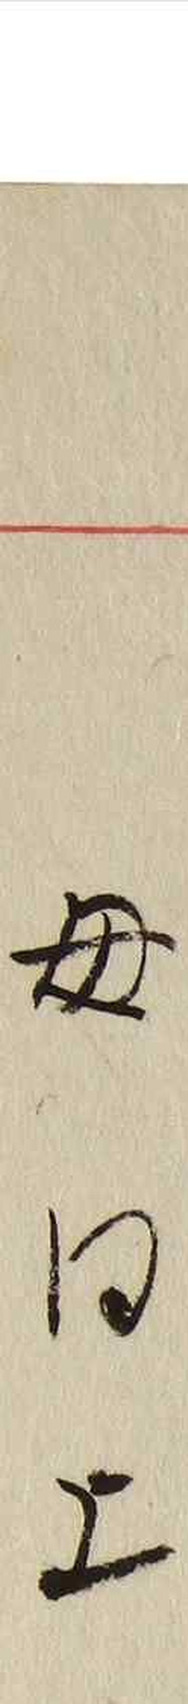母同上
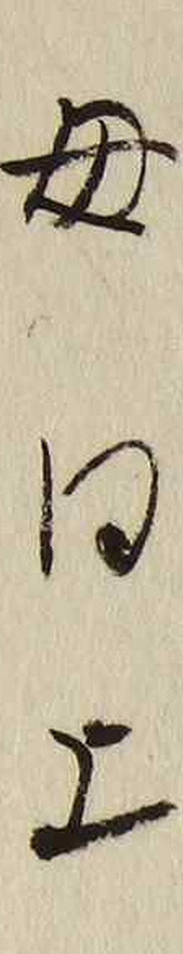母同上
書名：諸士系譜　巻之350　せ之部1冊全
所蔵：会津若松市立会津図書館
